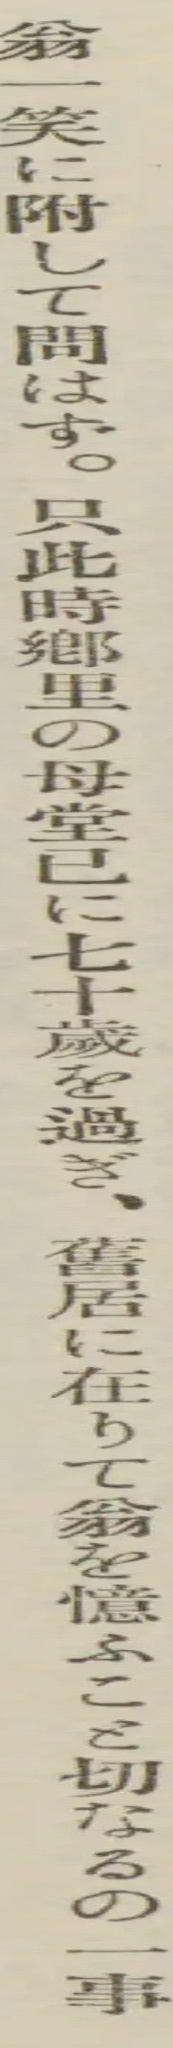翁一笑に附して問はず。只此時郷里の母堂已に七十歳を過ぎ、旧居に在りて翁を憶ふこと切なるの一事
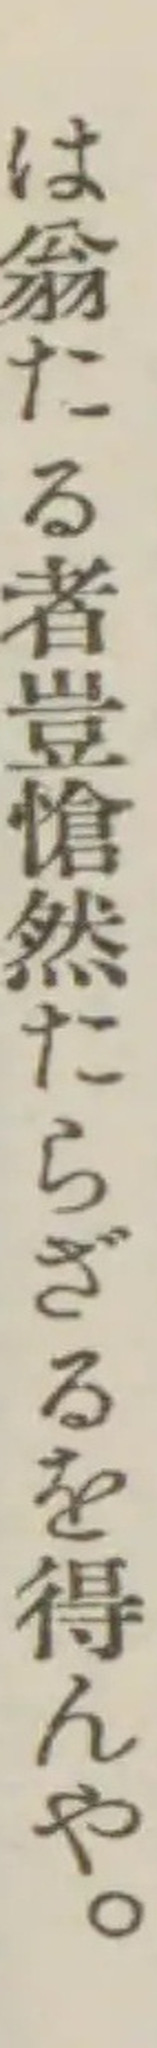は翁たる者豈愴然たらざるを得んや。
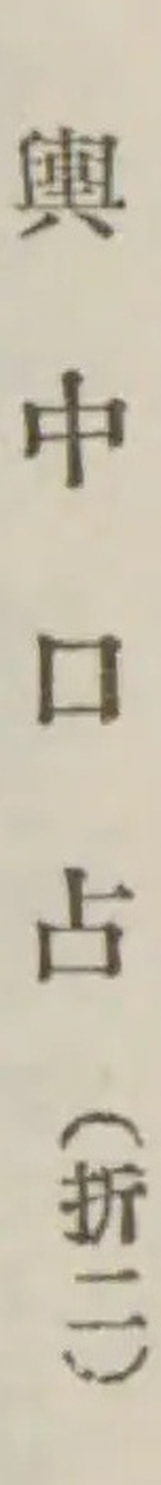輿中口占(折二)
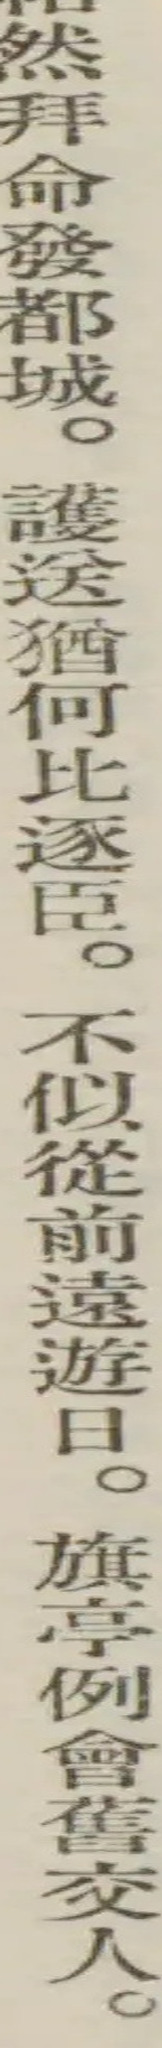帖然拜命發都城。護送猶何比遂臣。不似從前遠遊日。旗亭例會舊交人。
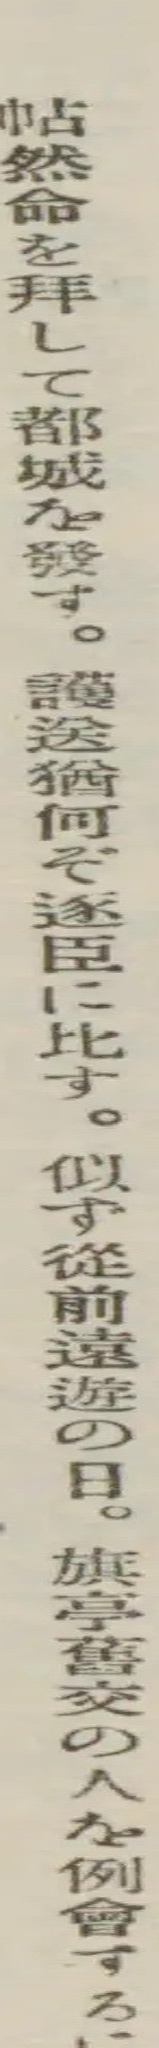帖然命を拝して都城を発す。護送猶何ぞ遂臣に比す。似ず従前遠遊の日。旗亭旧交の人を例会するに。
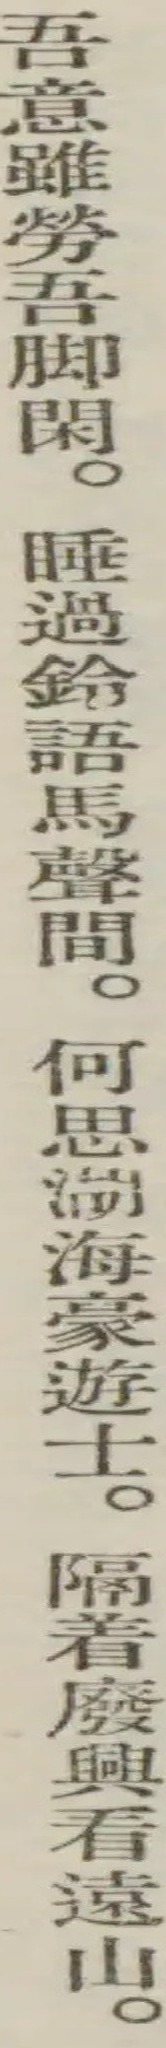吾意雖勞吾脚閑。睡過鈴語馬聲間。何思湖海豪遊士。隔着發興看遠山。
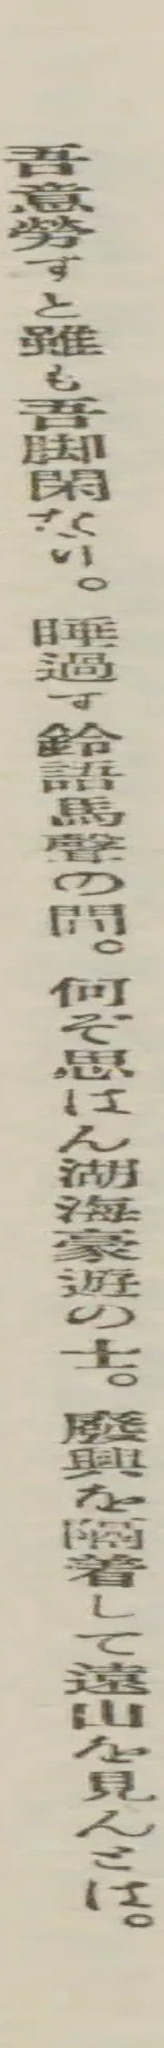吾意労すと雖も吾脚閑なり。睡過す鈴語馬声の間。何ぞ思はん湖海豪遊の士。発興を隔着して遠山を見んとは。
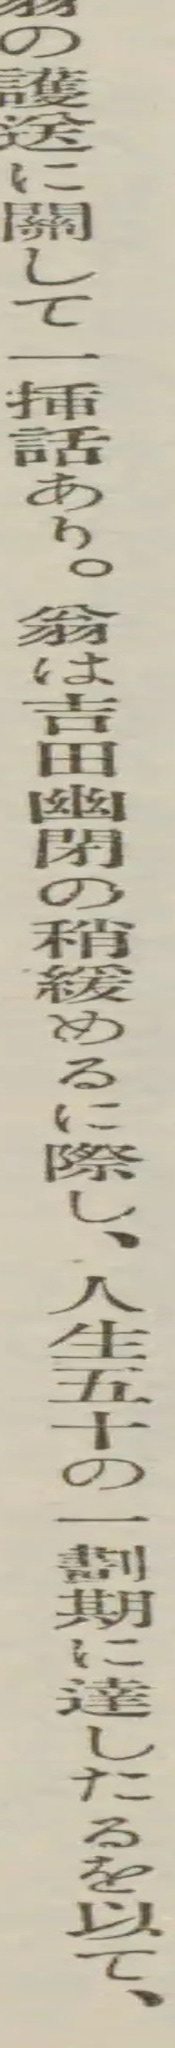翁の護送に関して一挿話あり。翁は吉田幽閉の稍緩めるに際し、人生五十の一劃期に達したるを以て、
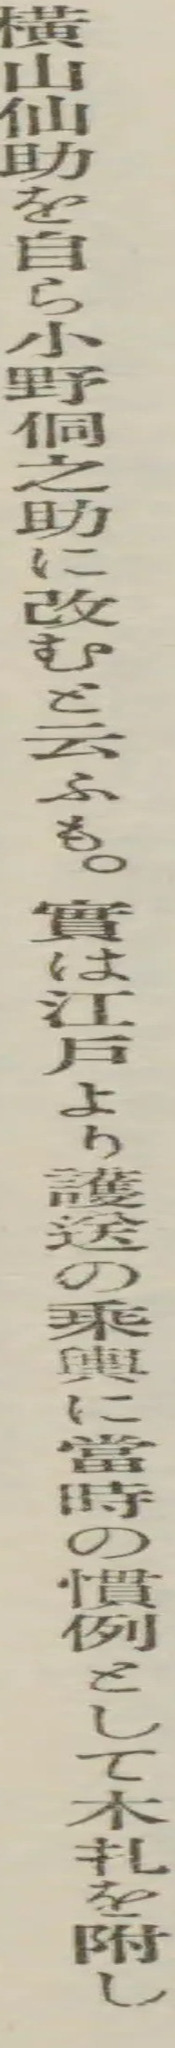横山仙助を自ら小野侗之助に改むと云ふも。実は江戸より護送の乗輿に当時の慣例として木札を附し
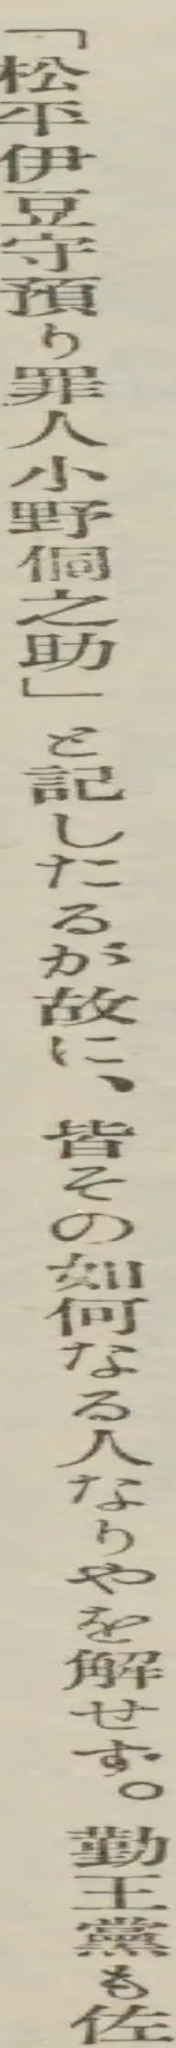「松平伊豆守預り罪人小野侗之助」と記したるが故に、皆その如何なる人なりやを解せず。勤王党も佐
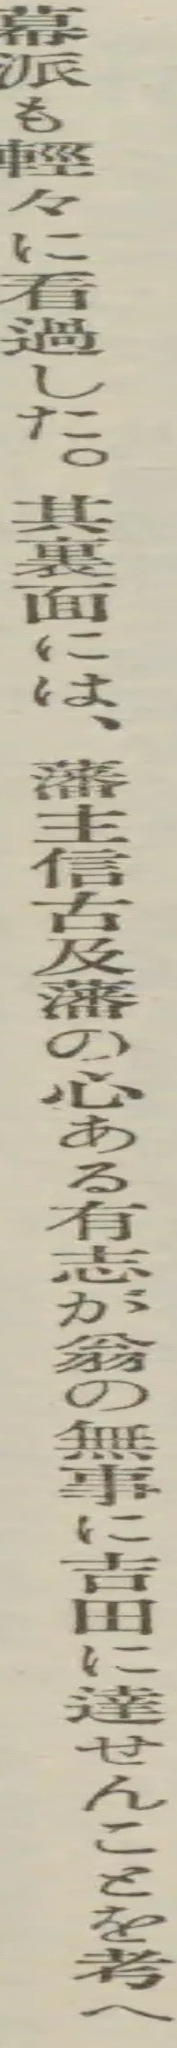幕派も軽々に看過した。其裏面には、藩主信古及藩の心ある有志が翁の無事に吉田に達せんことを考へ
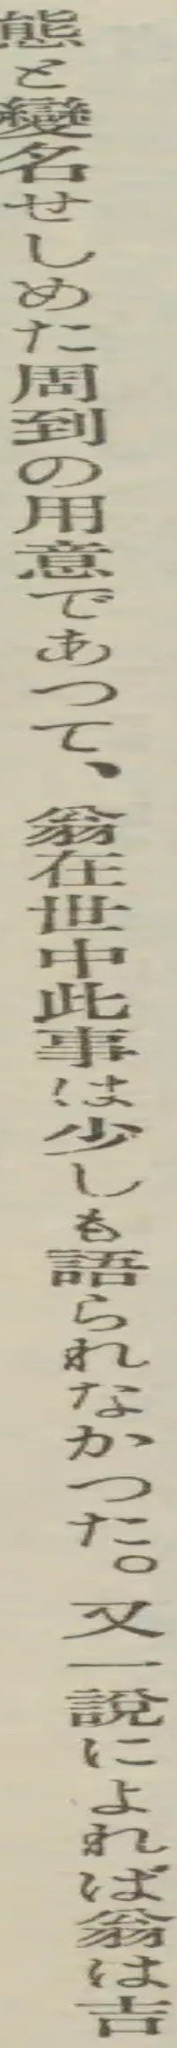態と変名せしめた周到の用意であつて、翁在世中此事は少しも語られなかつた。又一説によれば翁は吉
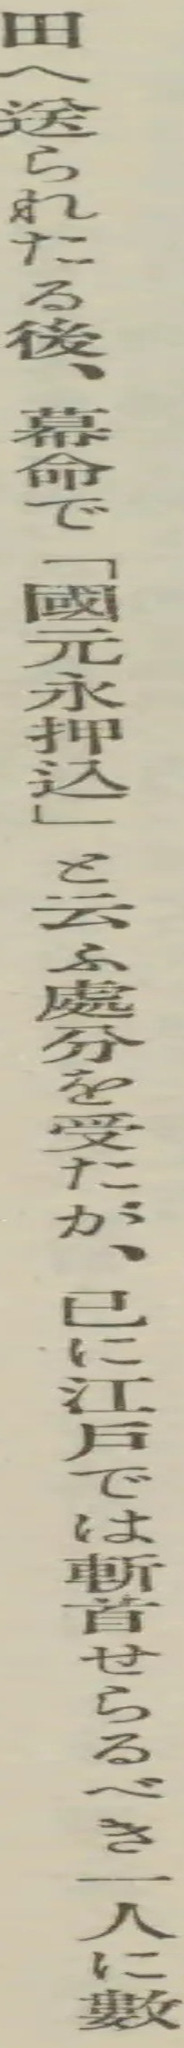田へ送られたる後、幕命で「国元永押込」と云ふ処分を受たが、已に江戸では斬首せらるべき一人に数
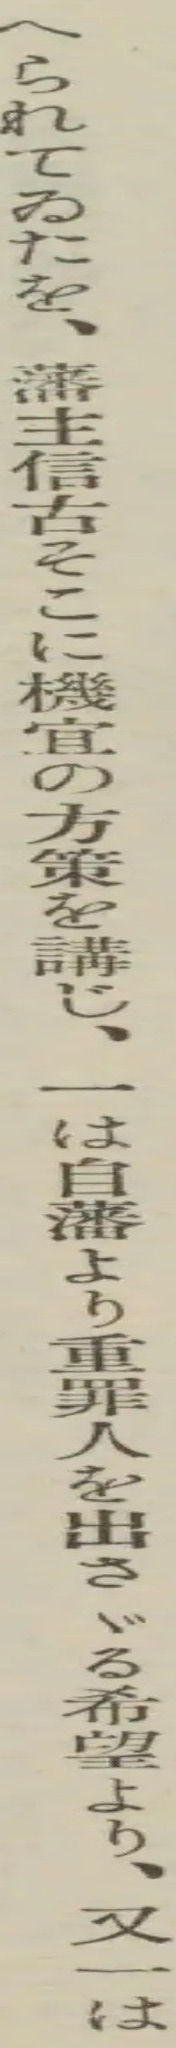へられてゐたを、藩主信古そこに機宜の方策を講じ、一は自藩より重罪人を出さゞる希望より、又一は、
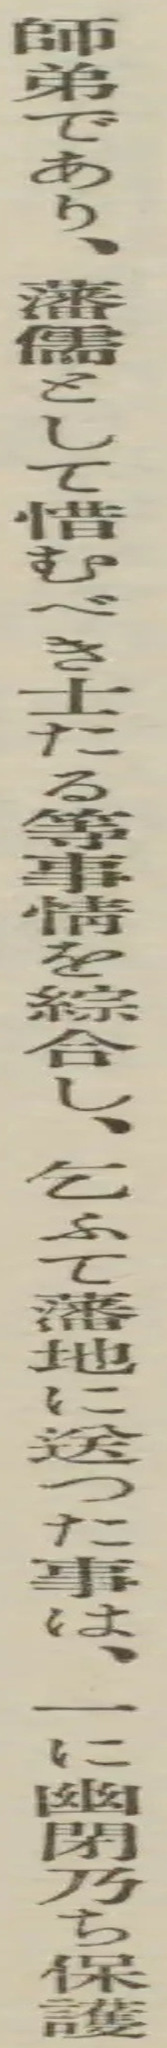師弟であり、藩儒として惜むべき士たる等事情を綜合し、乞ふて藩地に送つた事は、一に幽閉乃ち保護
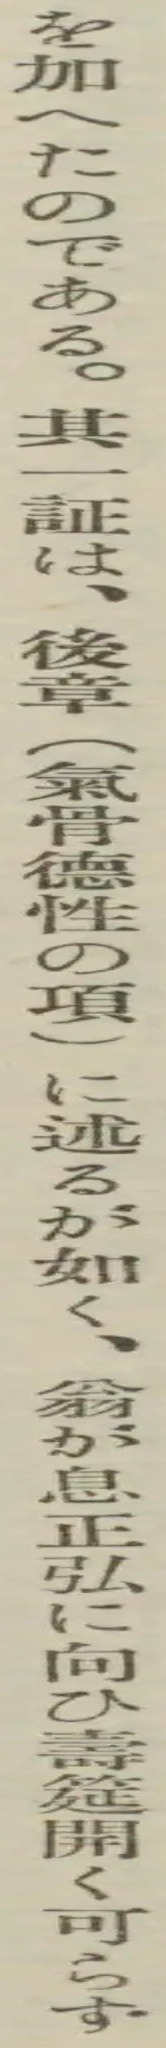を加へたのである。其一証は、後章(気骨徳性の項)に述るが如く、翁が息正弘に向ひ寿莚開く可らず
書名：小野湖山翁小伝
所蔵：国立国会図書館 National Diet Library, JAPAN
